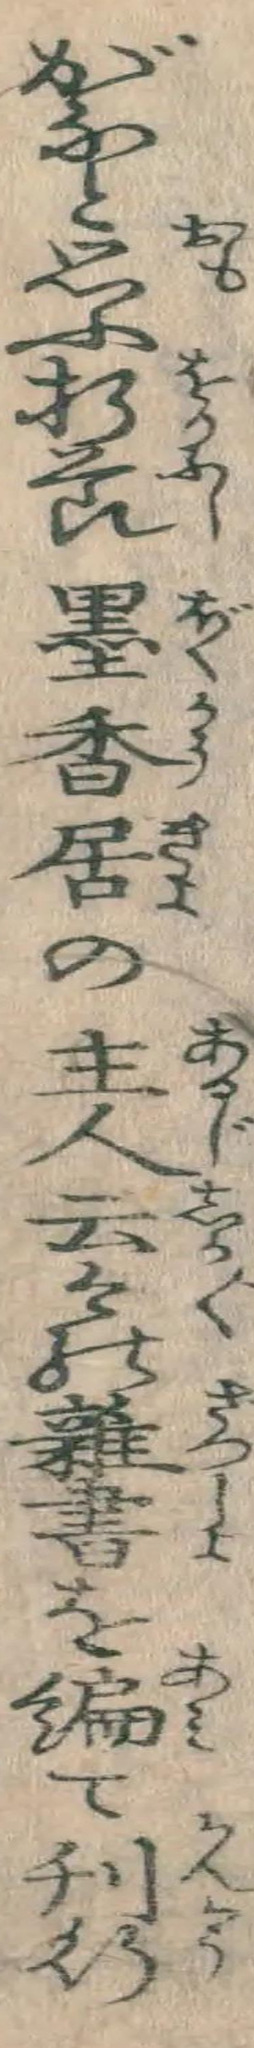がなと思ふ折節墨香居の主人云々の雑書を編て刊行
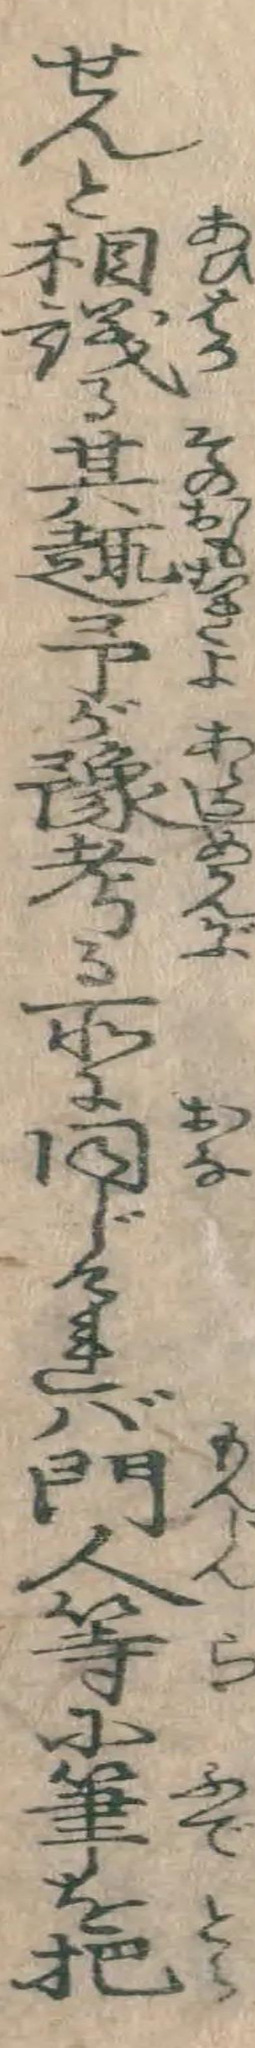せんと相議る其趣予が予考る所に同じければ門人等に筆を把

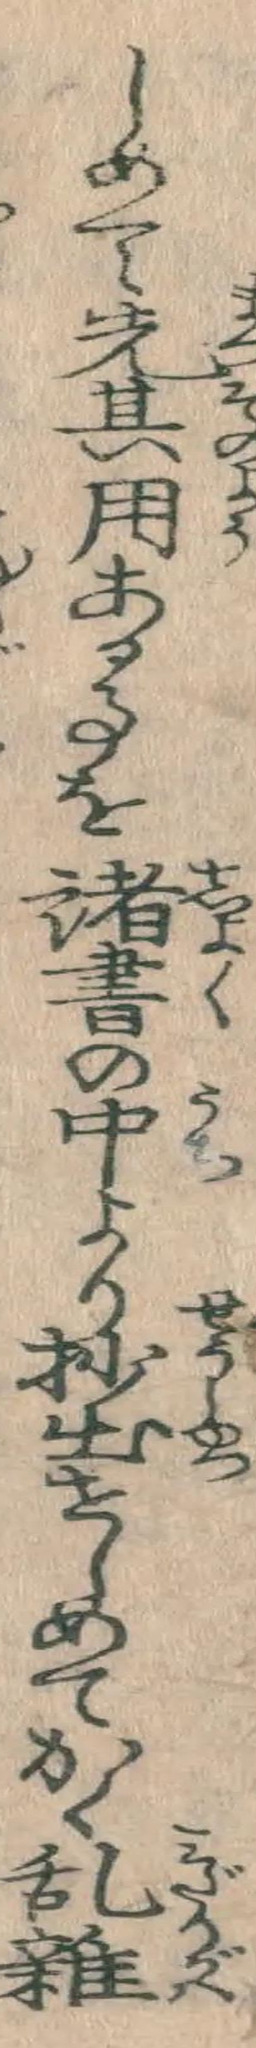しめて先其用ある事を諸書の中より抄出せしめてかく乱雑
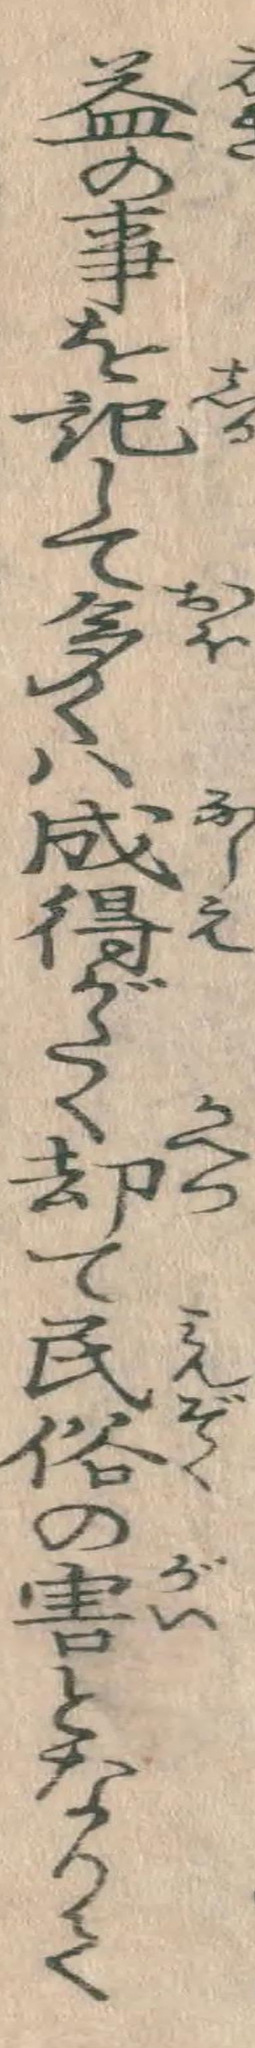益の事を記して多くは成得がたく却て民俗の害となりて
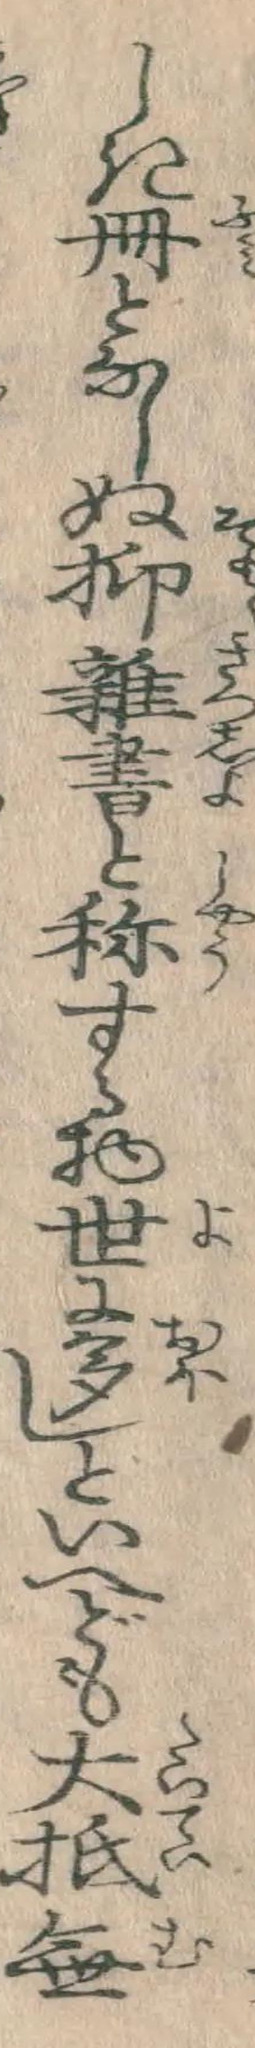しき冊となしぬ抑雑書と称する物世に多しといへども大抵無
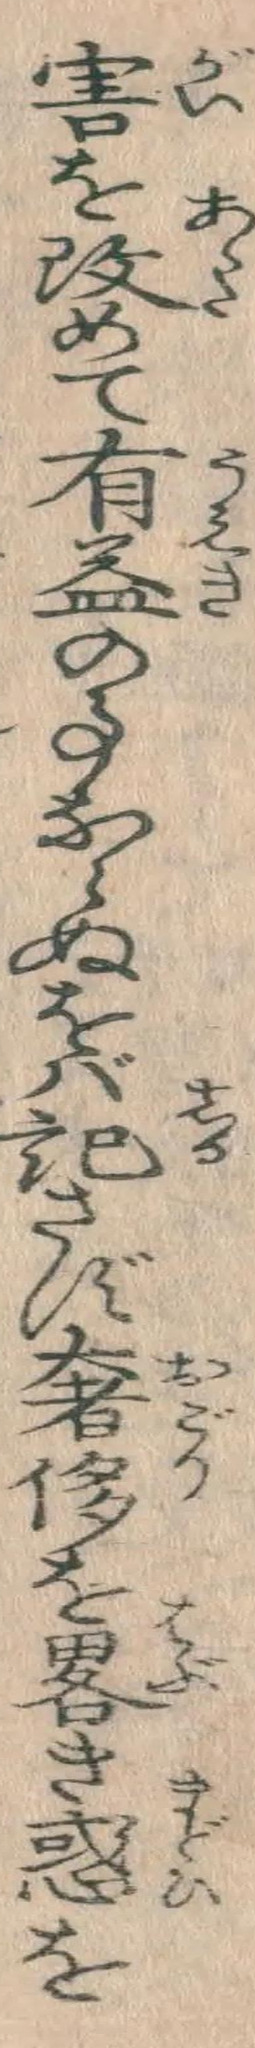害を改めて有益の事ならぬをば記さず奢侈を略き惑を
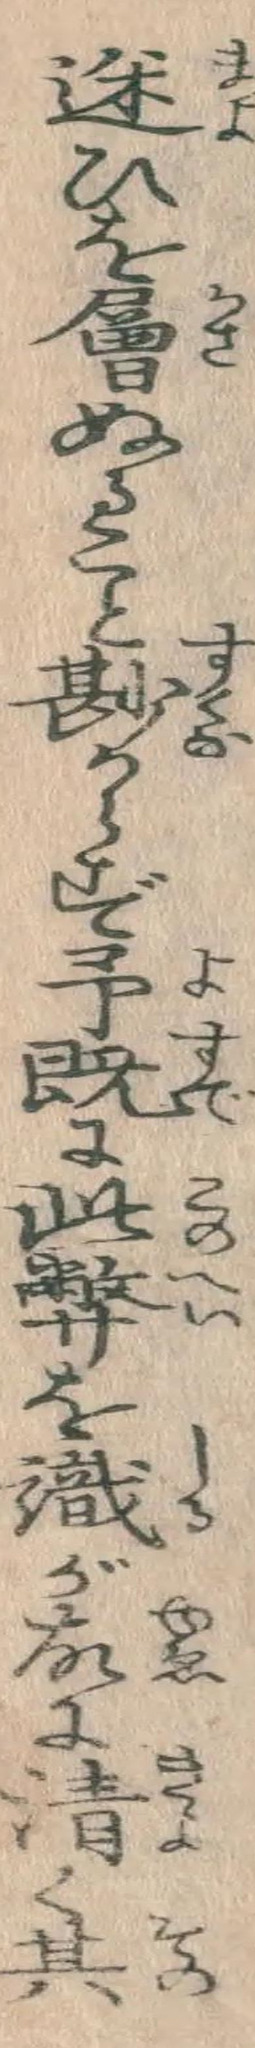迷ひを層ぬること尟からず予既に此弊を識が故に清く其
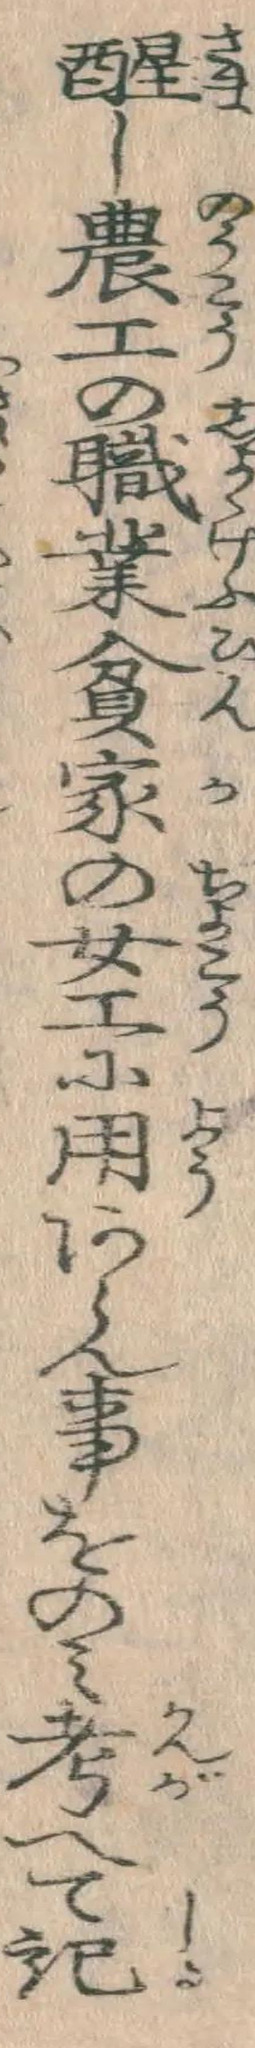醒し農工の職業貧家の女工に用あらん事をのみ考へて記
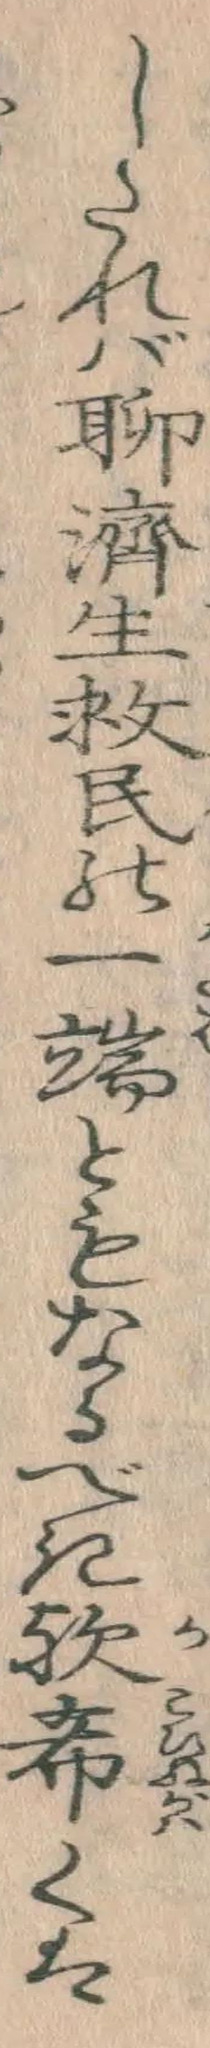したれば聊済生救民の一端ともなるべき歟希くは
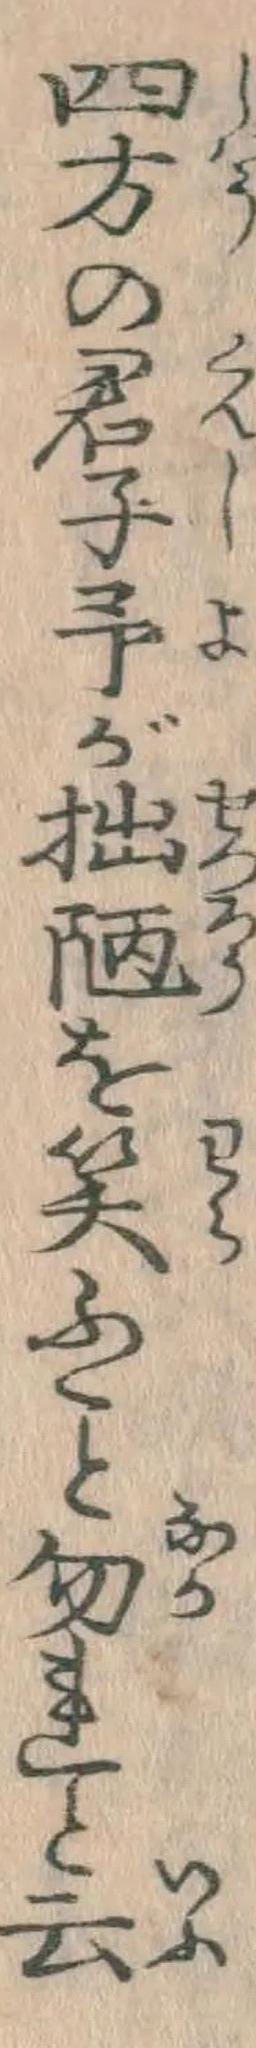四方の君子予が拙陋を笑ふこと勿れと云
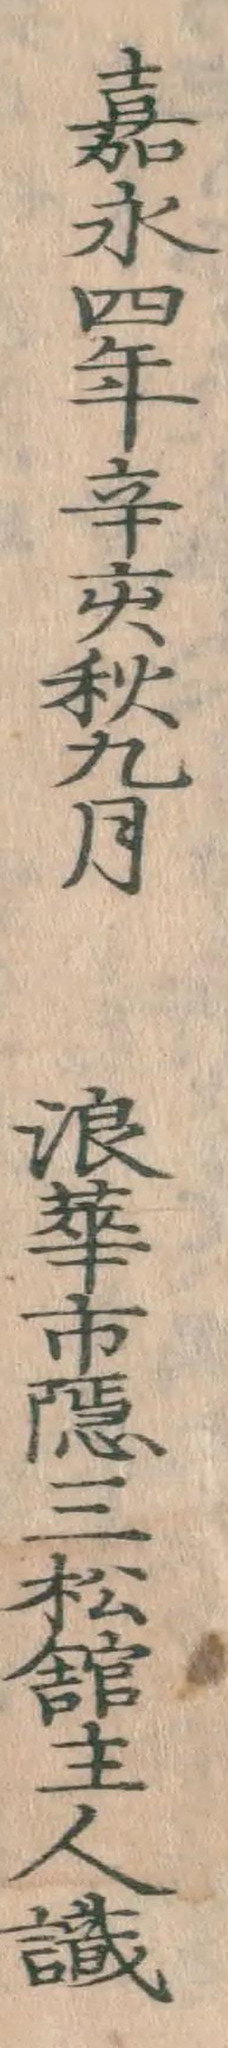嘉永四年辛亥秋九月浪華市隠三松館主人識
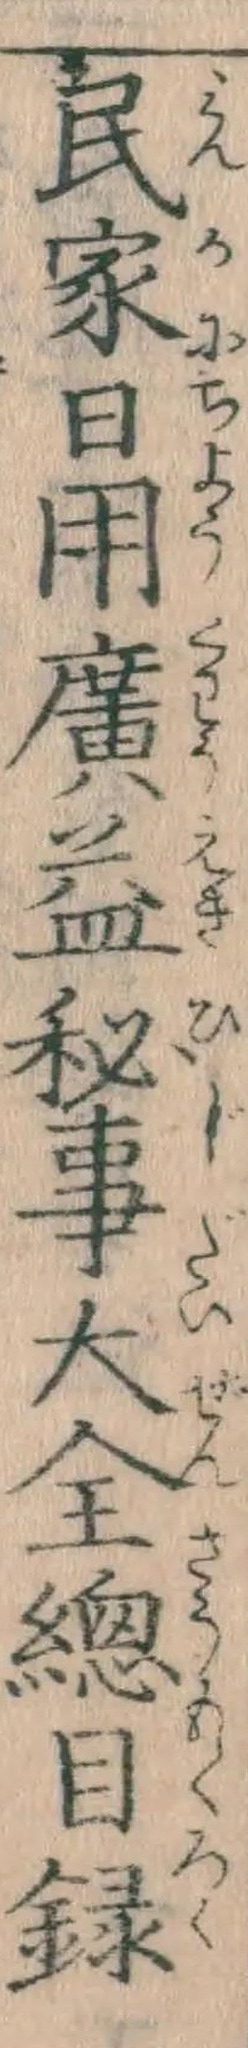民家日用公益秘事大全総目録
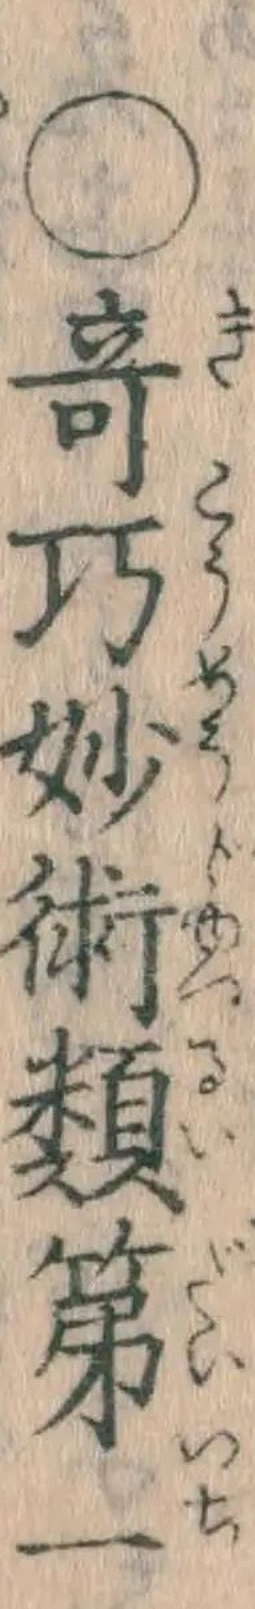○奇巧妙術類第一
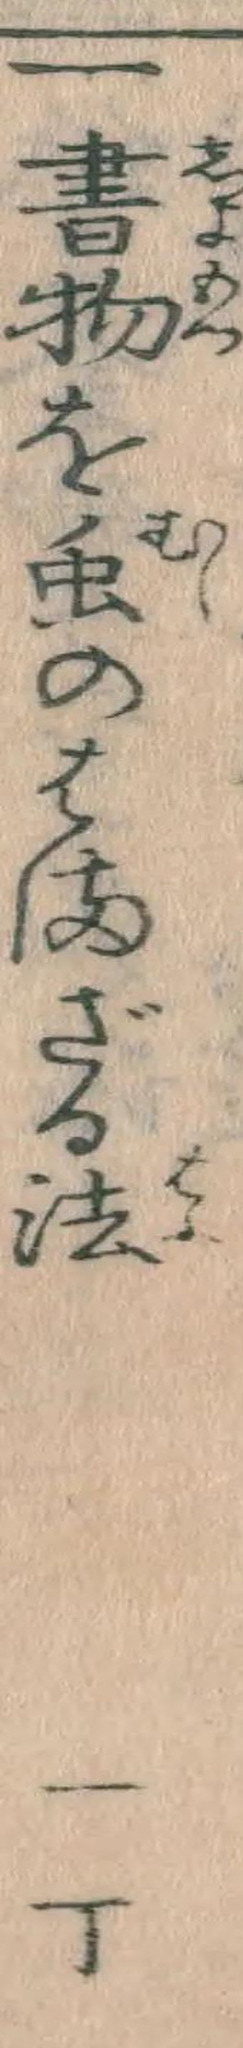一書物を虫のはまざる法一丁
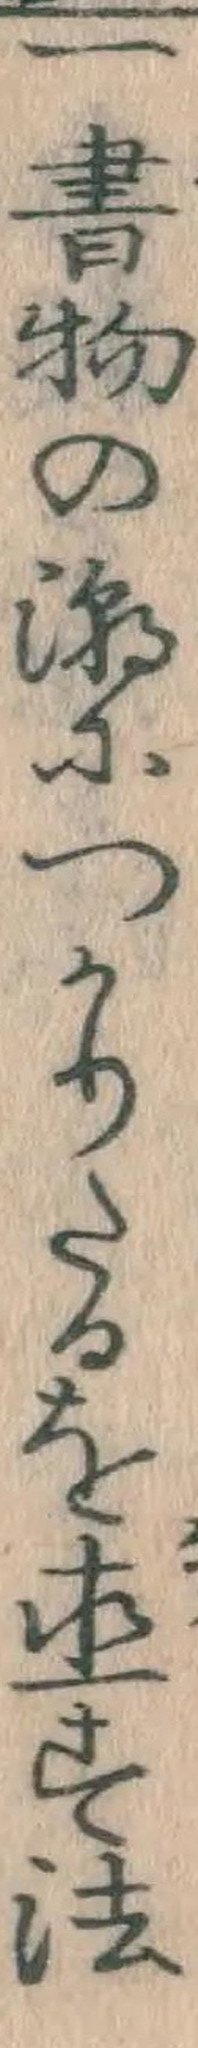一書物の潮につかりたるを直す法
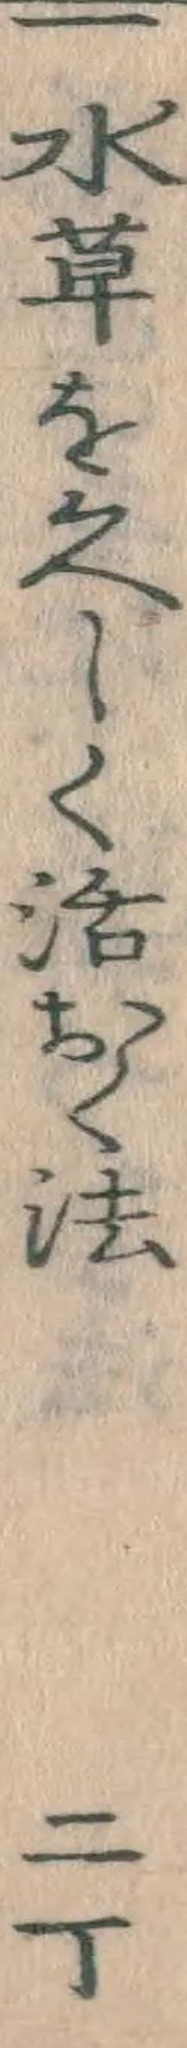一水草を久しく活おく法二丁
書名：広益秘事大全 3巻. [1]
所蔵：国立国会図書館 National Diet Library, JAPAN
